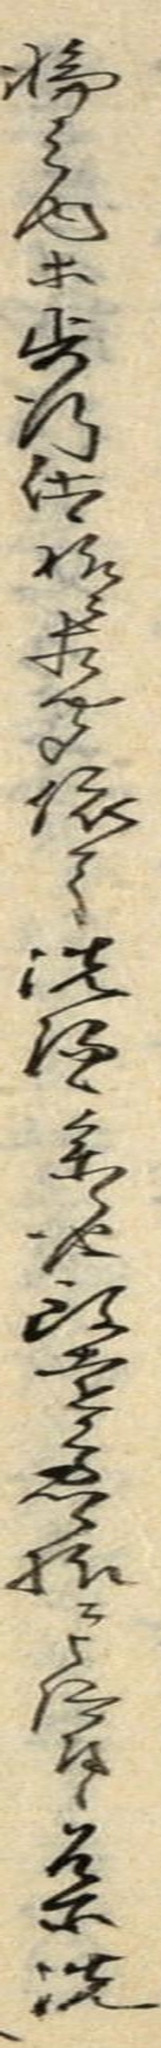輪之内等歩行仕候様に相聞依之洗湯へ参候儀致遠慮候様に被仰付候乍爾洗
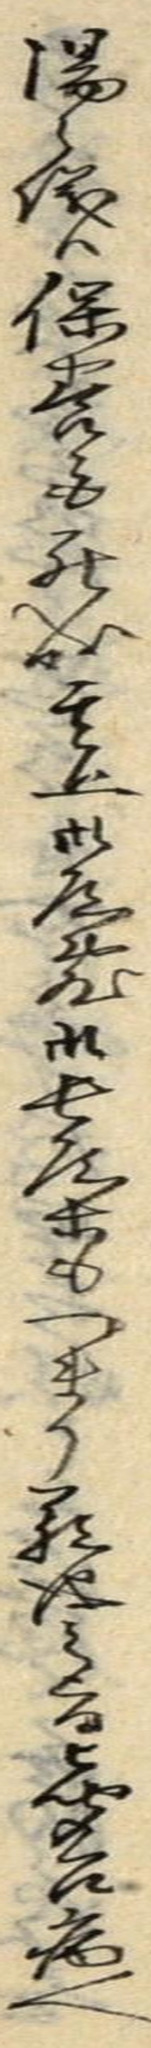湯之儀は保養にも罷成其上御屋敷御長屋等もつまり難儀之旨被聞召病人

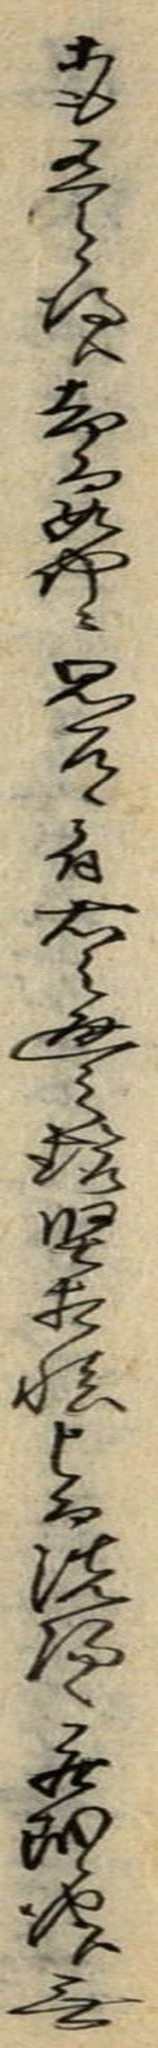等も有之候得は却て如何に思召候に付右之通之趣堅相慎申候て洗湯へ罷越候儀は無
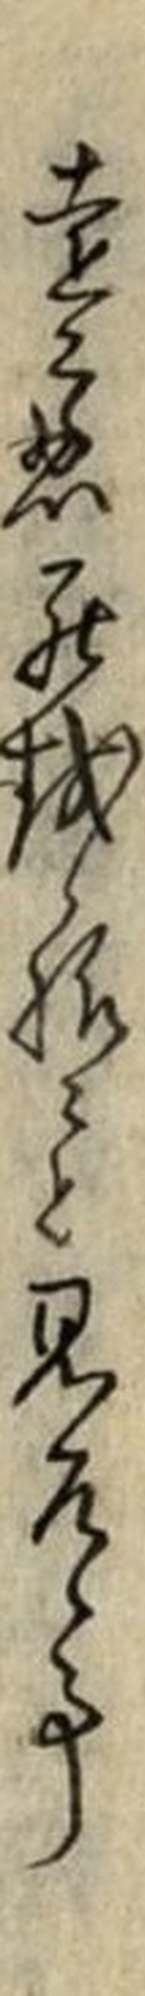遠慮罷越候様にと思召候事
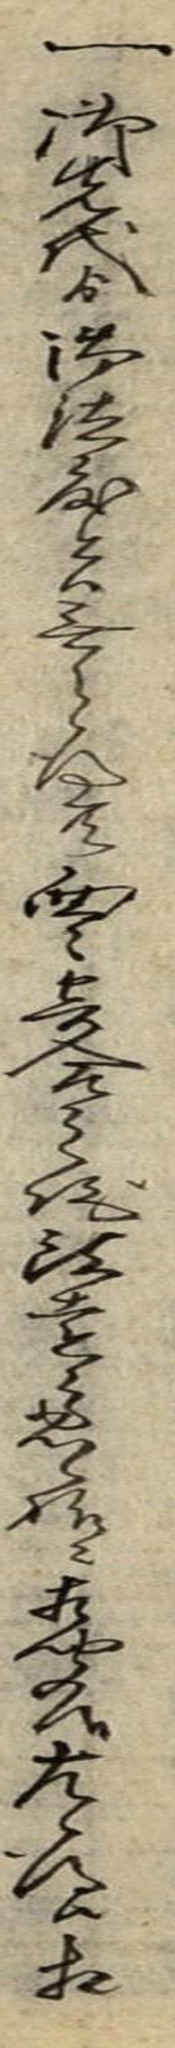一御先代ゟ御法度には無之候得共面々寄合之儀致遠慮候様に相聞候左候得は相
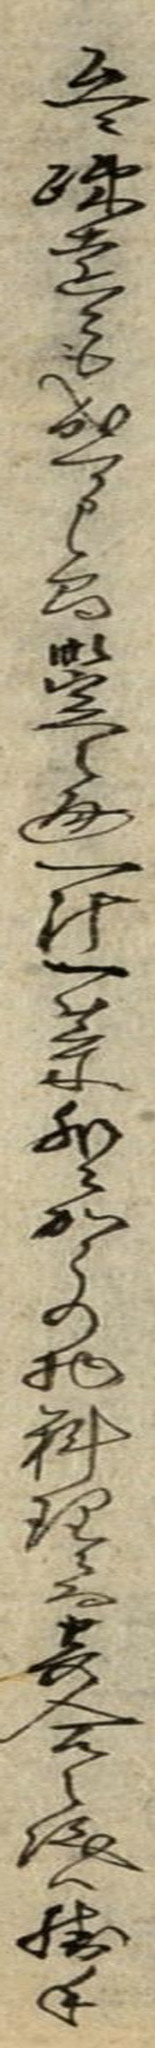互に疎遠にも成可申候間御定之通一汁一菜外にかうの物料理にて寄合之儀は勝手
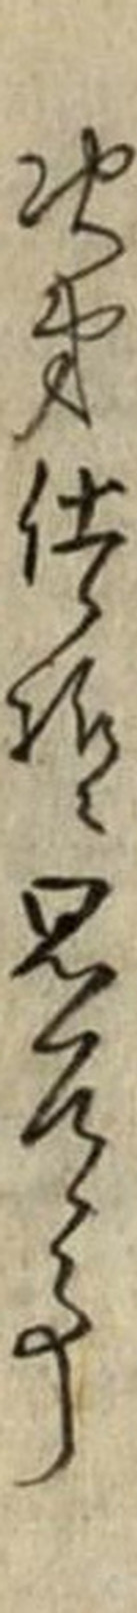次第仕候様に思召候事
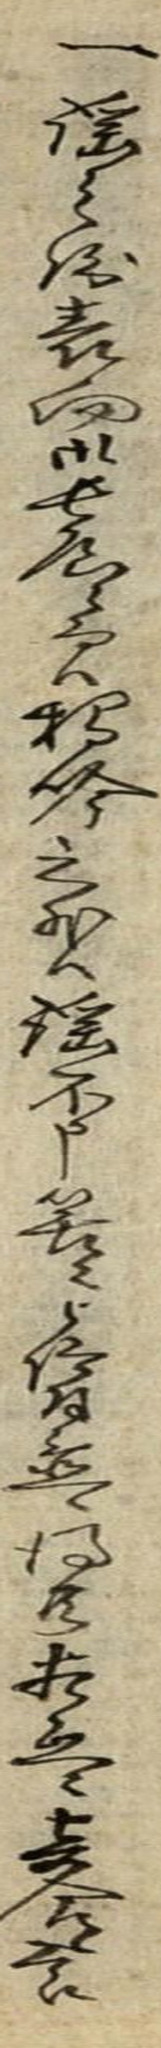一謡之儀表向御長屋にては独吟之外は謡不申筈に被仰付置候得共相互に寄合候節
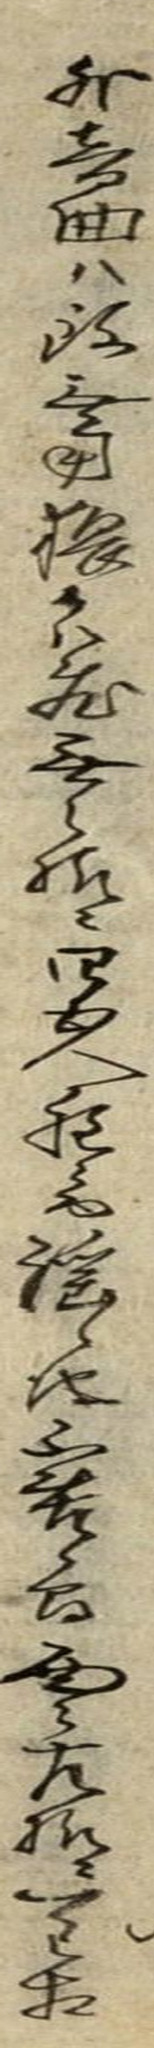外音曲は致無用猥かは敷無之用に四五人程にて謡候儀不苦候間面々左様に可被相
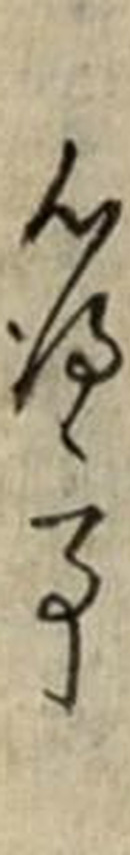心得候事
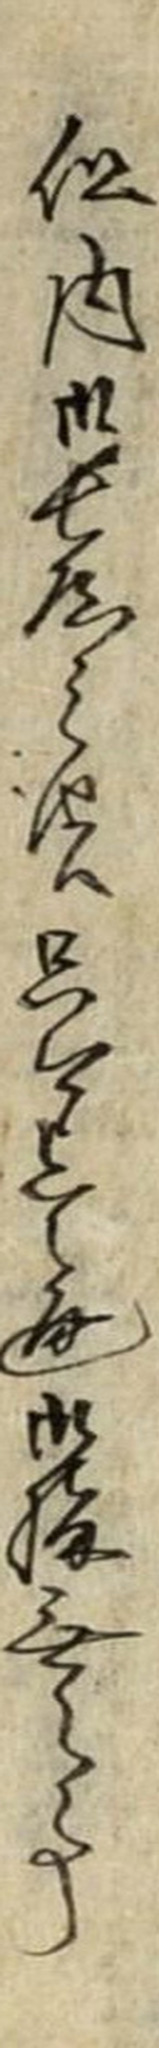但内御長屋之儀は只今迄之通御構無之事
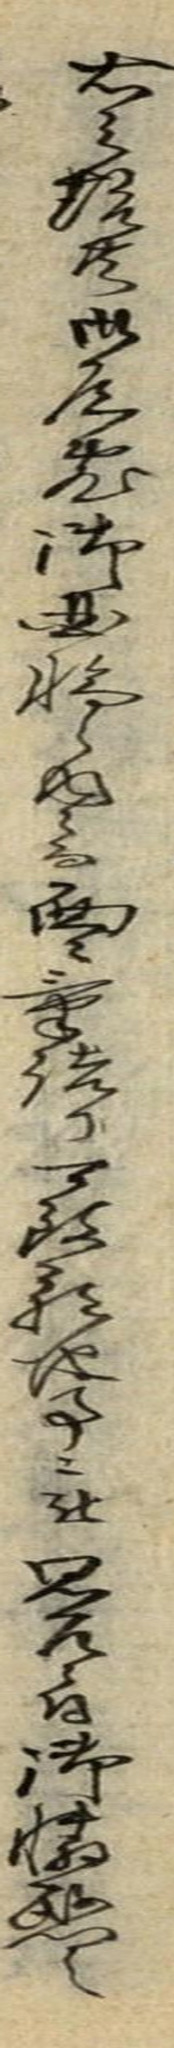右之趣共御長屋御曲輪之内にて面々気詰り可致難儀事に被思召候付御憐愍之
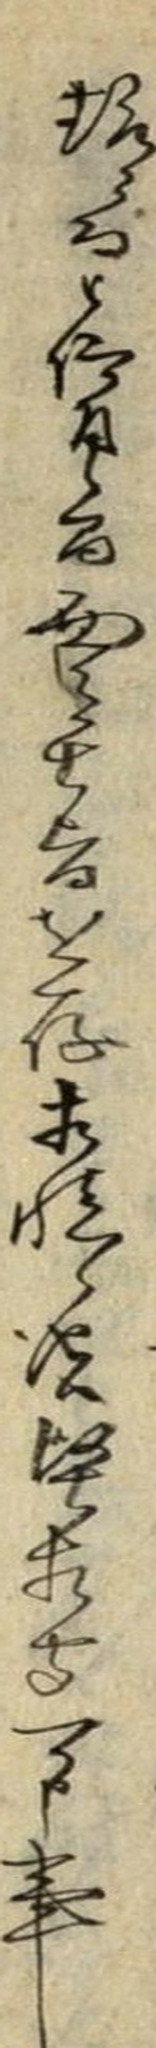趣にて被仰付候間面々其旨を存相慎候儀は堅相守可申事
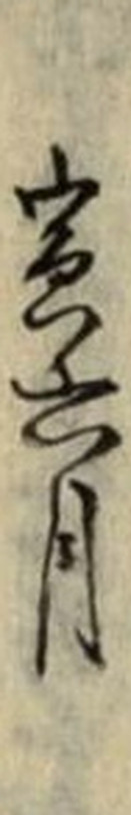寅六月
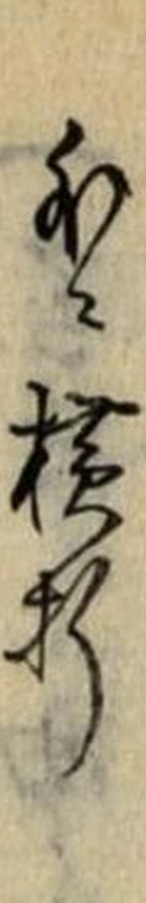外に横折
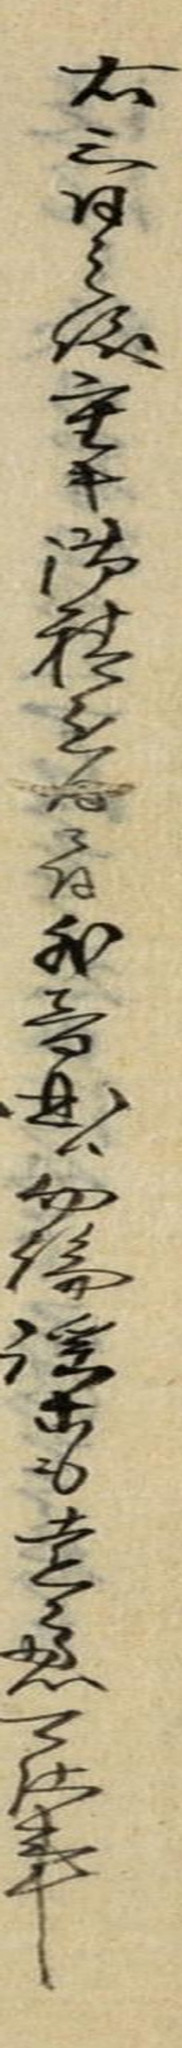右三日之儀重き御精進日に付き外音曲は勿論謡等も遠慮可仕事
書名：三都并道中之部
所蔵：福井県文書館 Fukui Prefectural Archives
